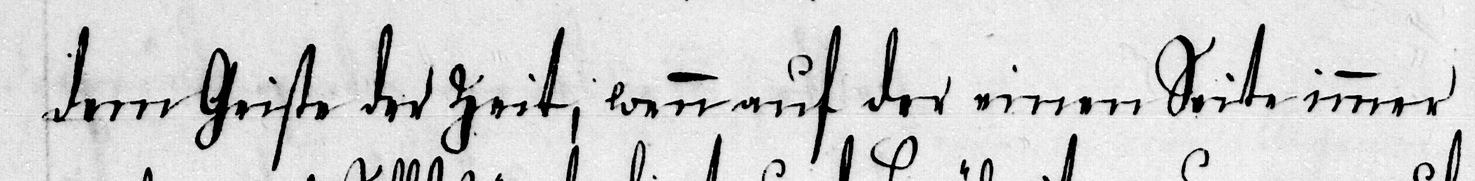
dem Geiste der Zeit, wenn auf der einen Seite immer
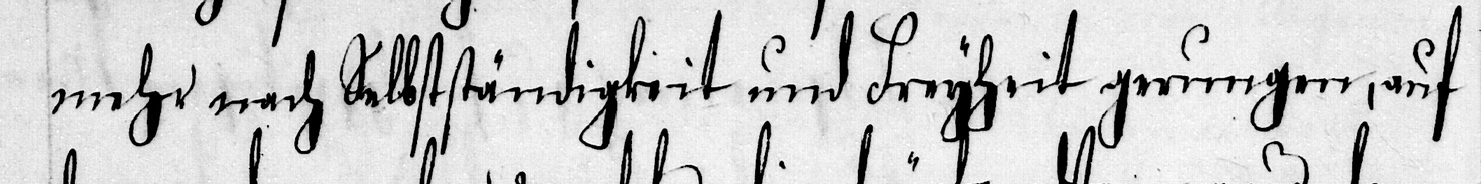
mehr nach Selbstständigkeit und Freyheit gerungen, auf
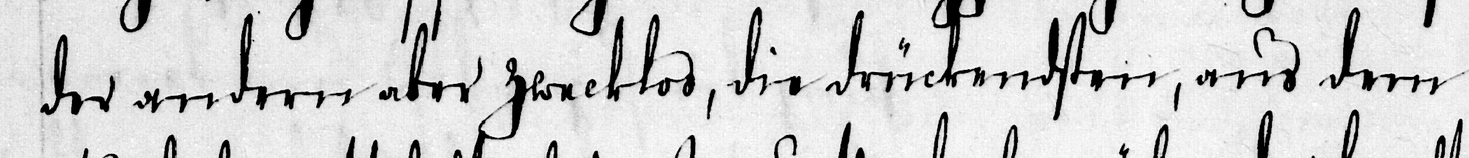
der andern aber zwecklos, die drückendsten, aus dem
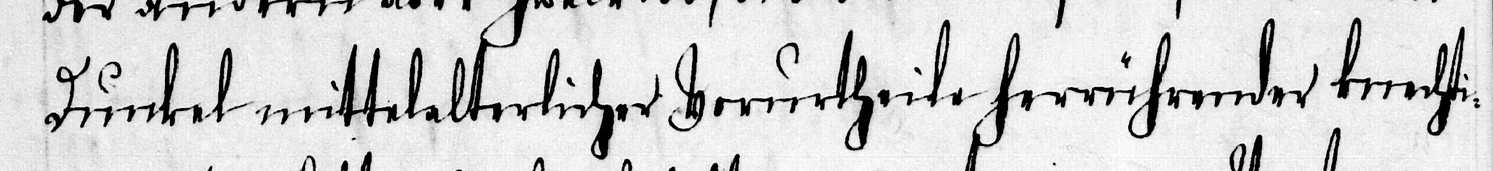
Dunkel mittelalterlicher Vorurtheile herrührender knecht¬
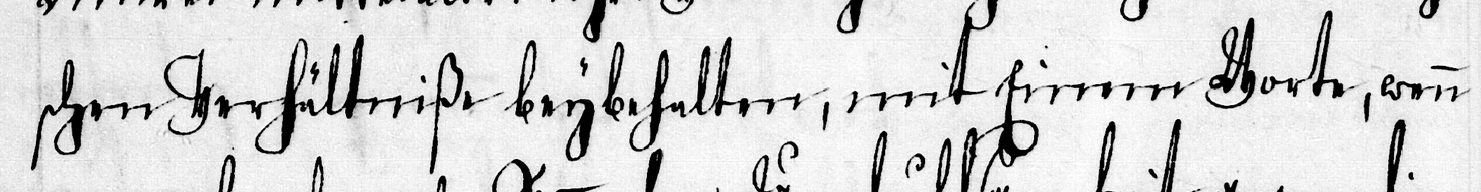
ischen Verhältniße beybehalten, mit einem Worte, wenn
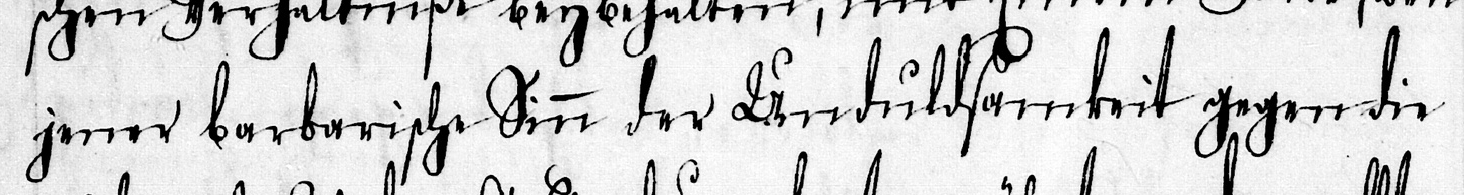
jener barbarische Sinn der Unduldsamkeit gegen die
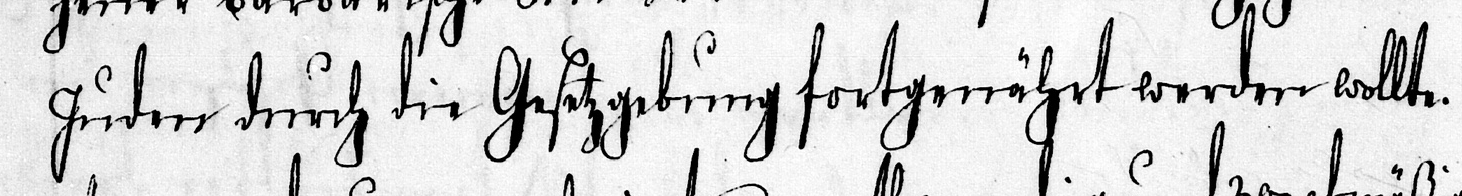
Juden durch die Gesetzgebung fortgenährt werden wollt¬
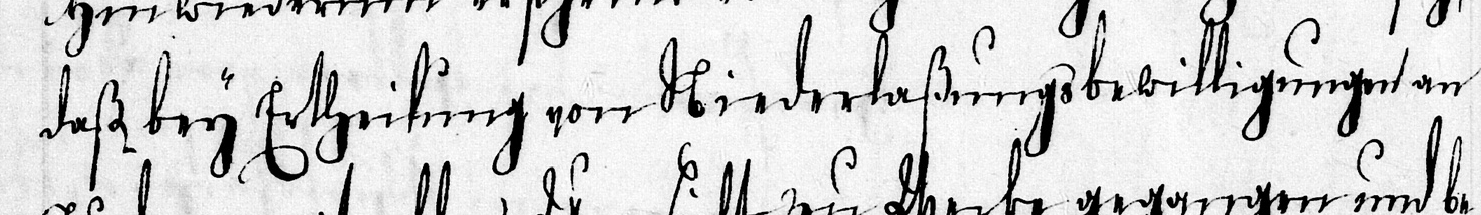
daß bey Ertheilung von Niederlaßungsbewilligungen an
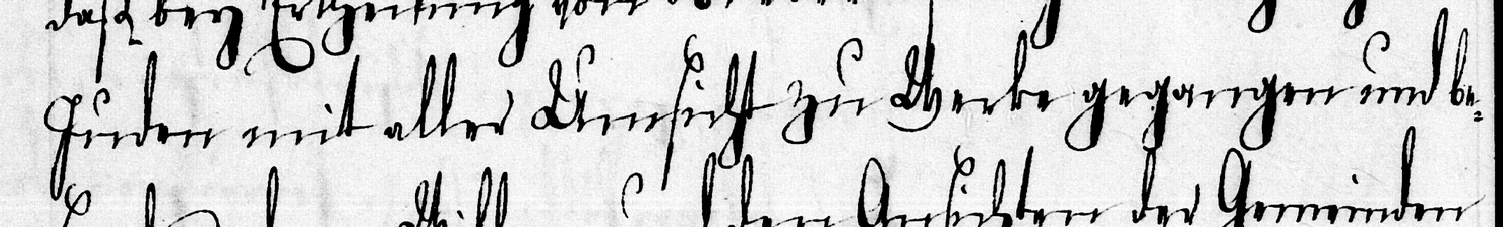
Juden mit aller Umsicht zu Werke gegangen und be¬
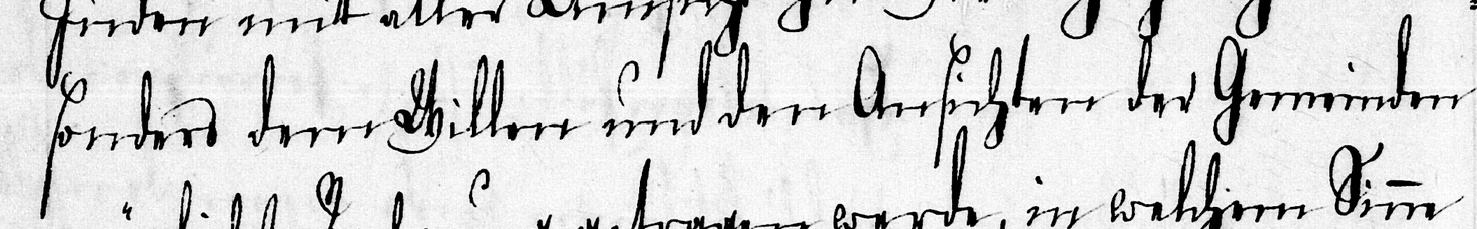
sonders dem Willen und den Ansichten der Gemeinden
